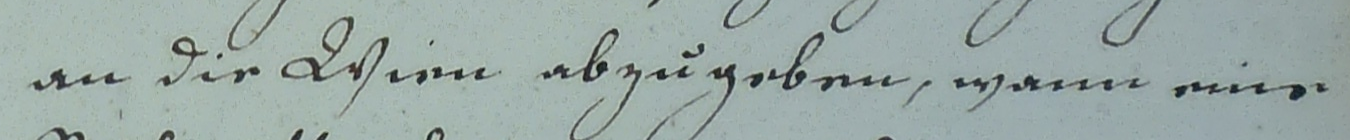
an die Wien abzugeben, wann eine
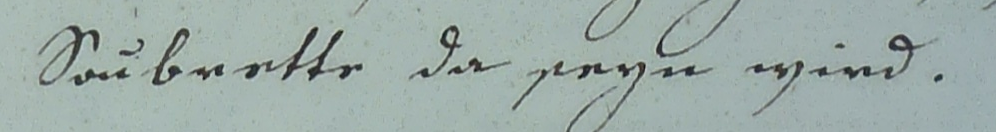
Soubrette da seyn wird.
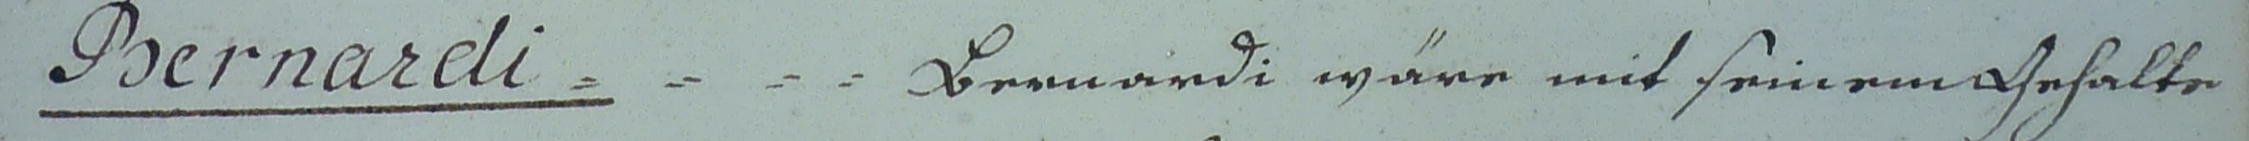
Bernardi : : : : Bernardi wäre mit seinem Gehalte
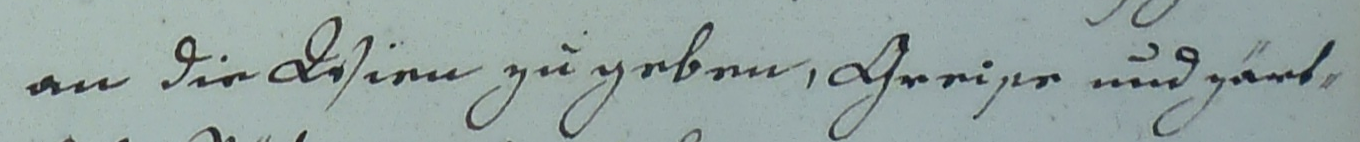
an die Wien zu geben, Greise und zärt¬
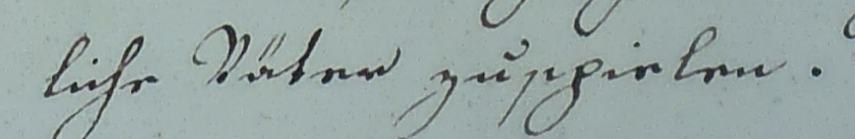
liche Väter zuspielen.
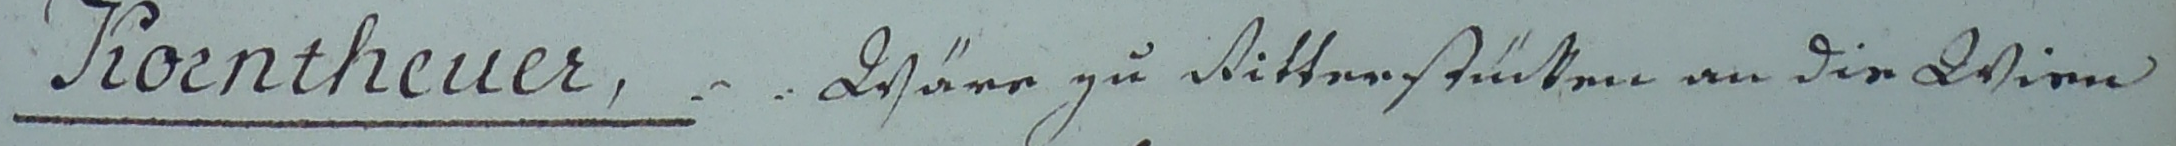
Korntheuer, : : Wäre zu Ritterstücken an die Wien
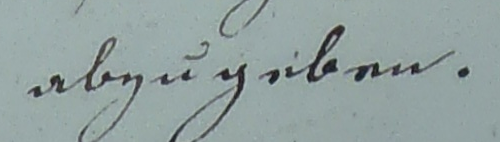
abzugeben.
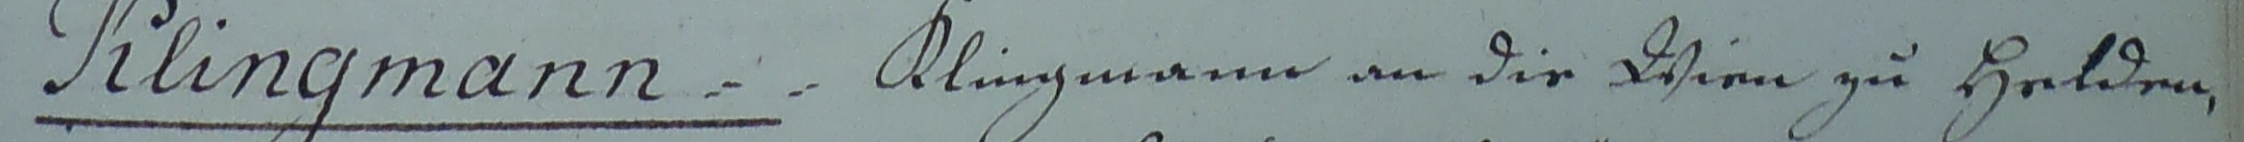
Klingmann : : Klingmann an die Wien zu Helden,
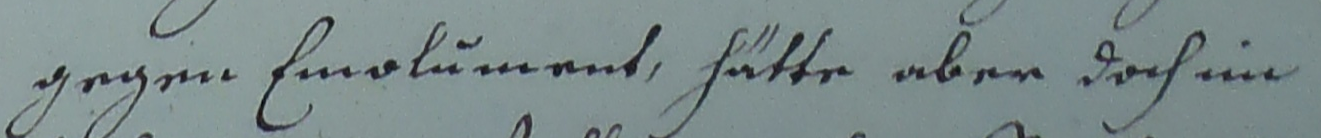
gegen Emolument, hätte aber doch im
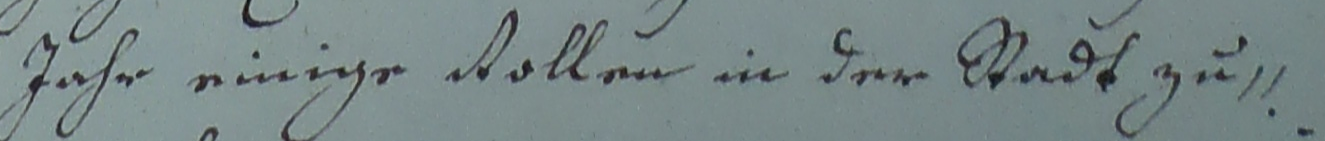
Jahr einige Rollen in der Stadt zu¬
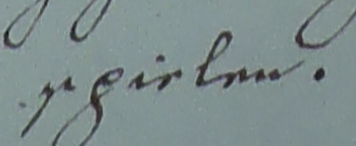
spielen.
